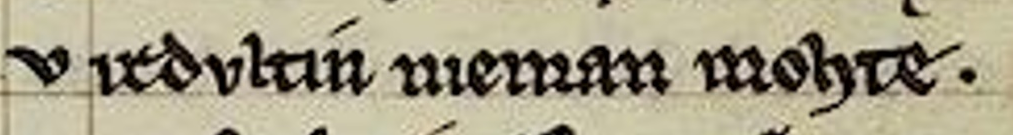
Virdvltin nieman mohte.
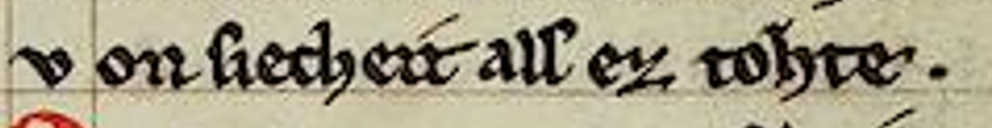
Von ſiecheit alſ ez tohte.
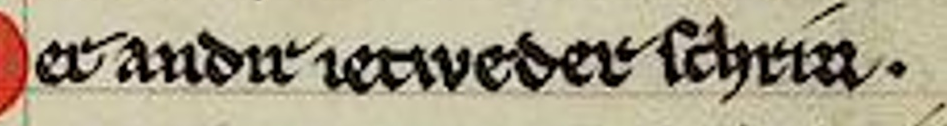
*Der andir ietweder ſchrin.
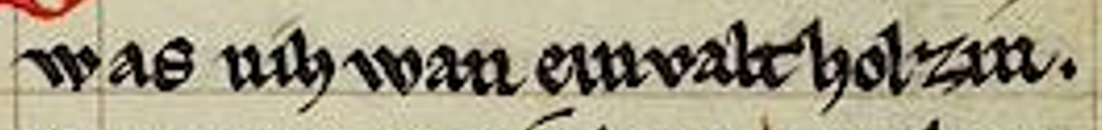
Was nih wan einvalt holzin.
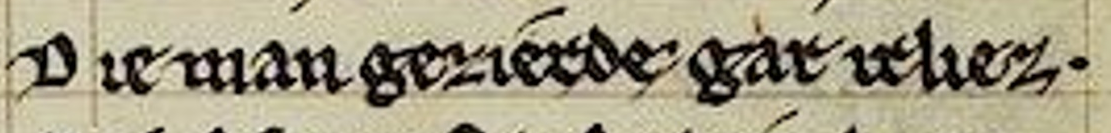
Die man gezierde gar irliez.
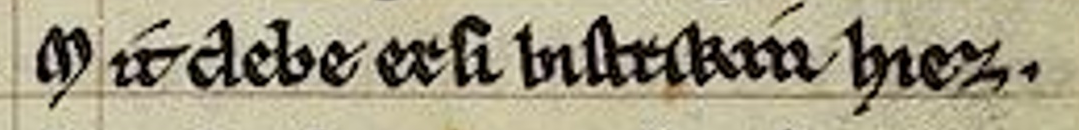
Mit clebe erſi biſtrikin hiez.
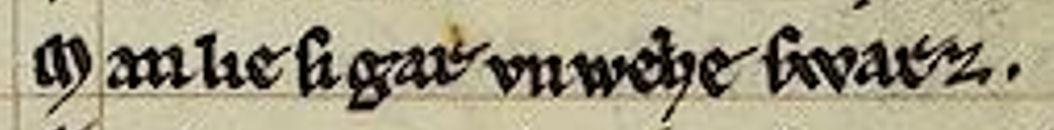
Man lie ſi gar vnwehe ſwarz.
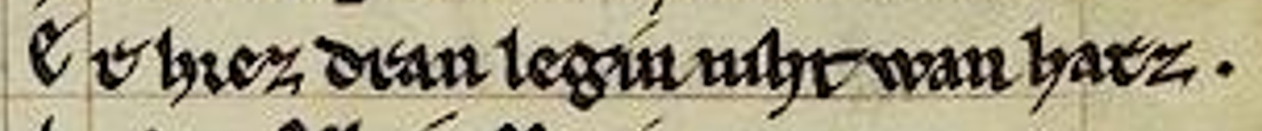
Er hiez dran legin niht wan harz.
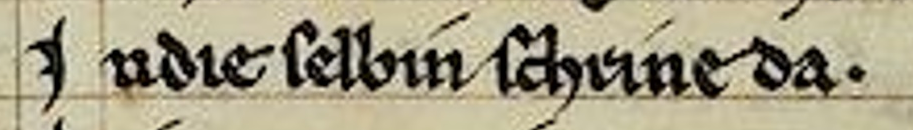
Indie ſelbin ſchrine da.
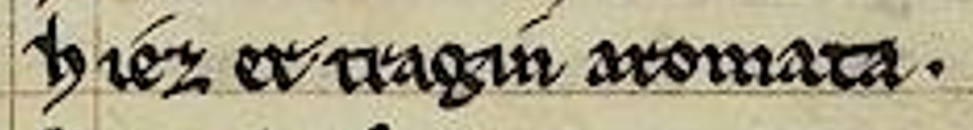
Hiez er tragin aromata.
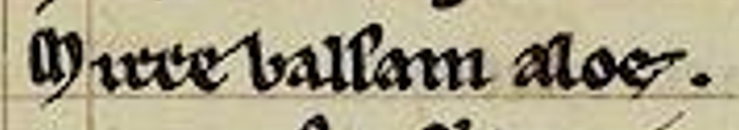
Mirre balſam aloe.
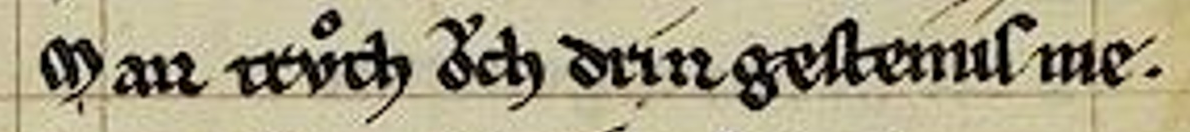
Man trv°och o°vch drin geſteiniſ me.
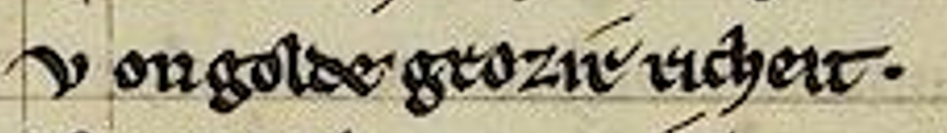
Von golde grozir richeit.
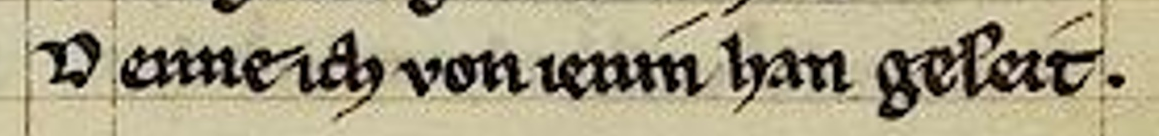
Denne ich von ienin han geſeit.
